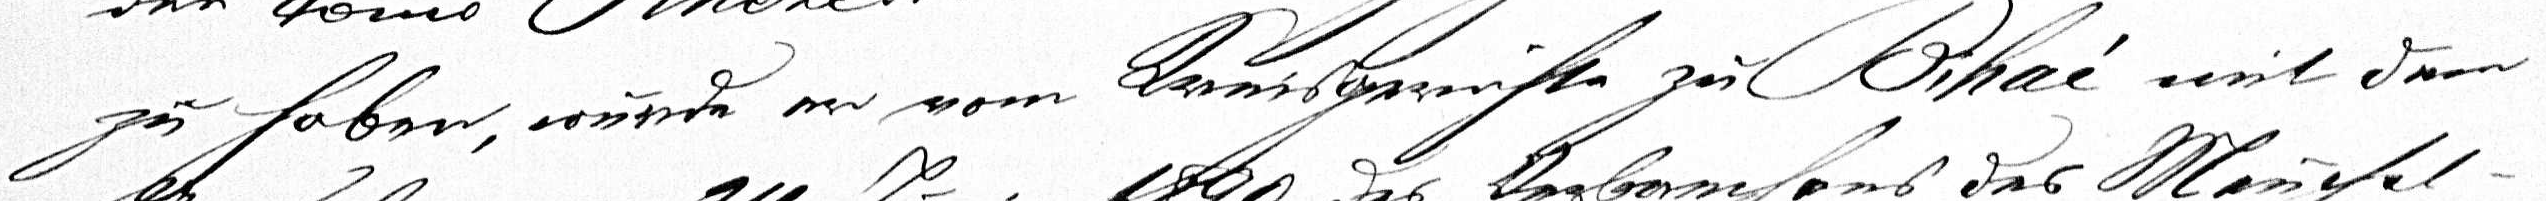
zu haben, wurde er vom Kreisgerichte zu Bihać mit dem
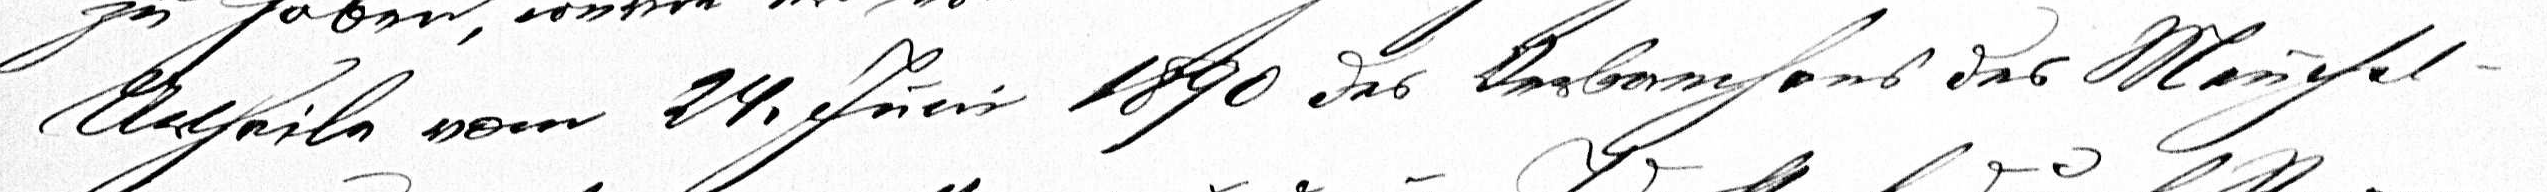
Urtheile vom 24. Juni 1890 des Verbrechens des Meuchel¬
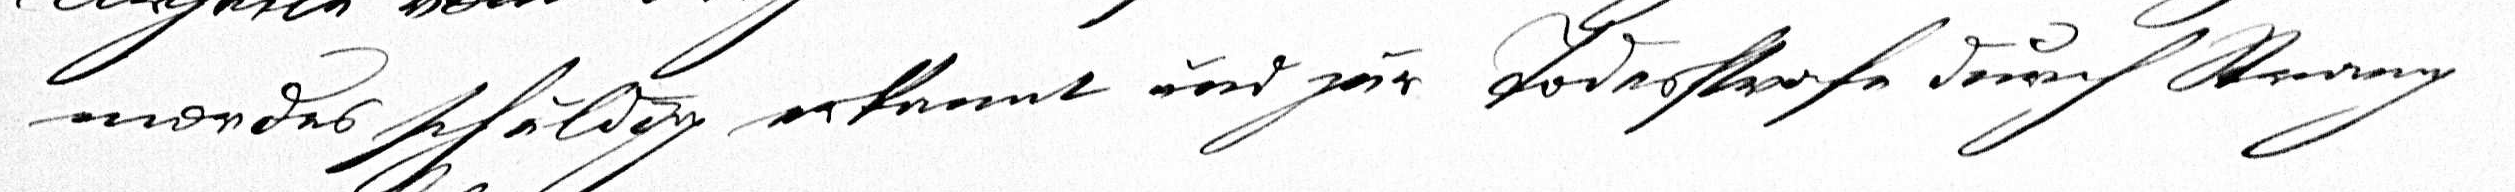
mordes schuldig erkannt und zur Todesstrafe durch Strang
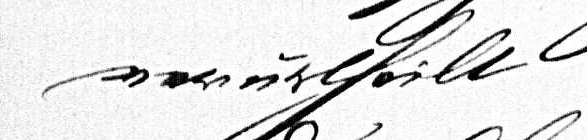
verurtheilt
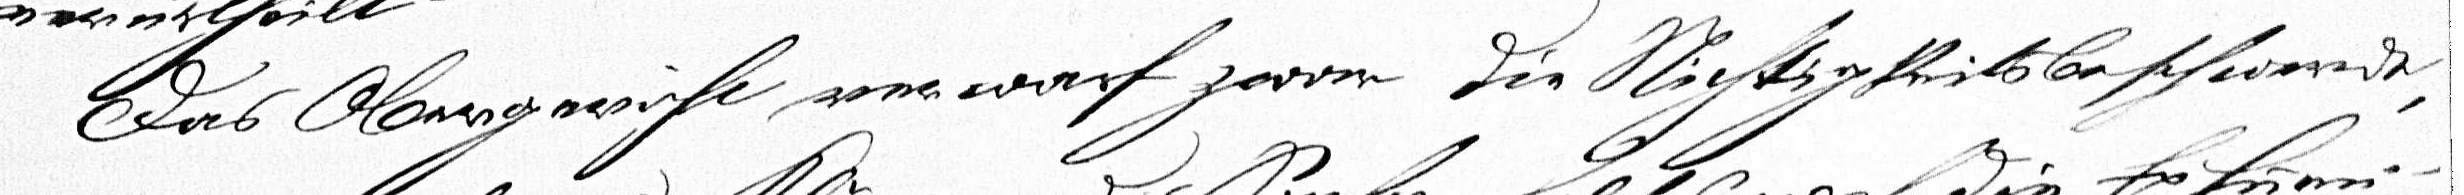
Das Obergericht verwarf zwar die Nichtigkeitsbeschwerde,
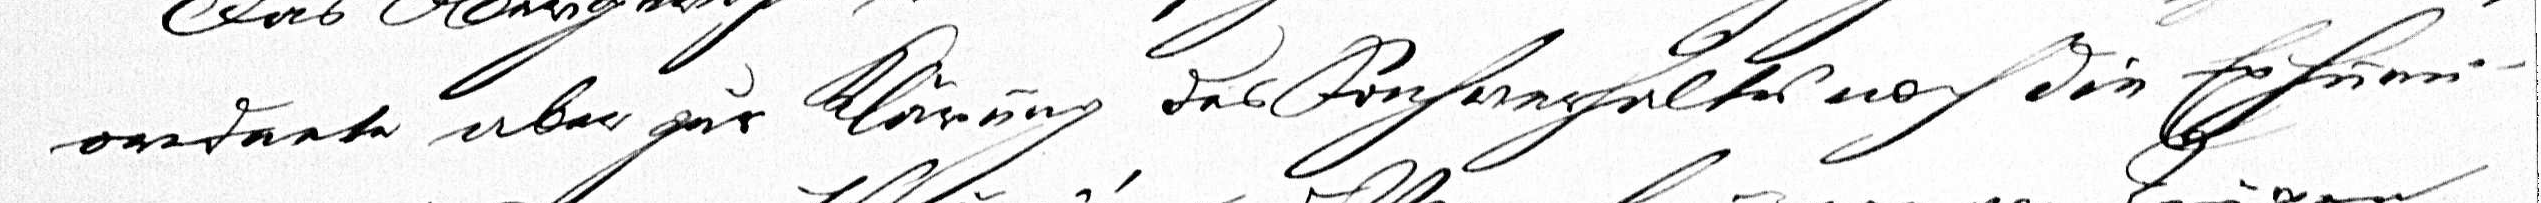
ordnete aber zur Klärung des Sachverhaltes noch die Epxx¬
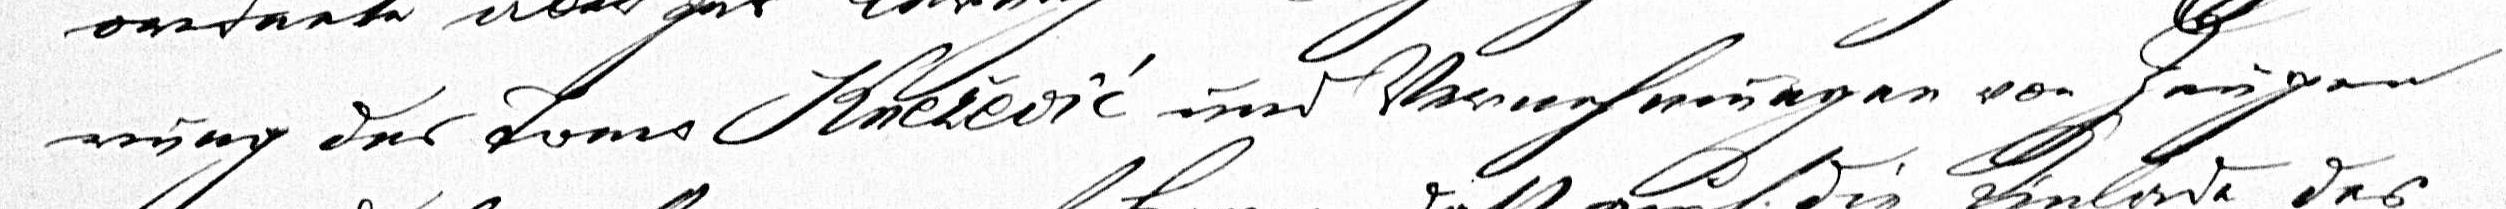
rung des Toms Knežević und Vernehmungen von Zeugen
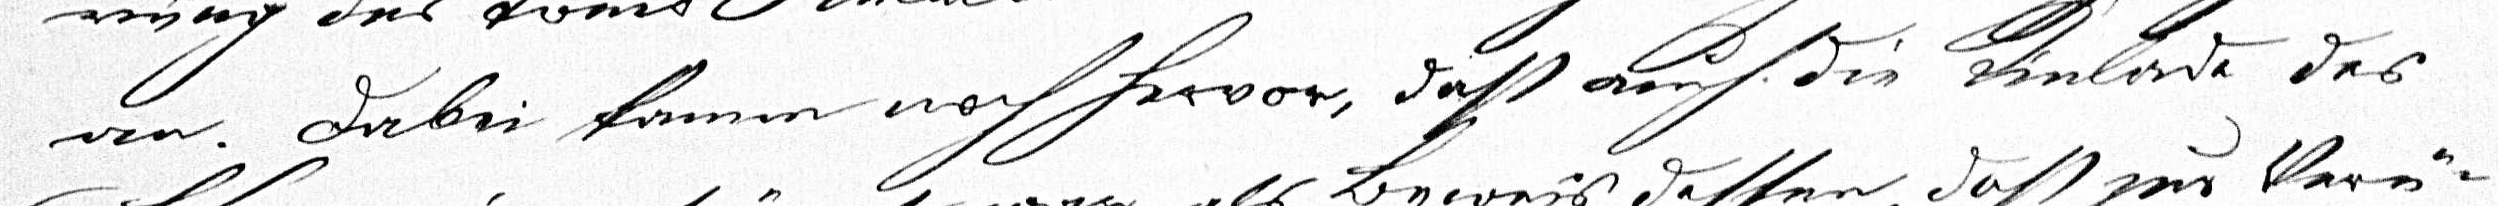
an. Dabei kamm noch hervor, daß auch die Kinlade des
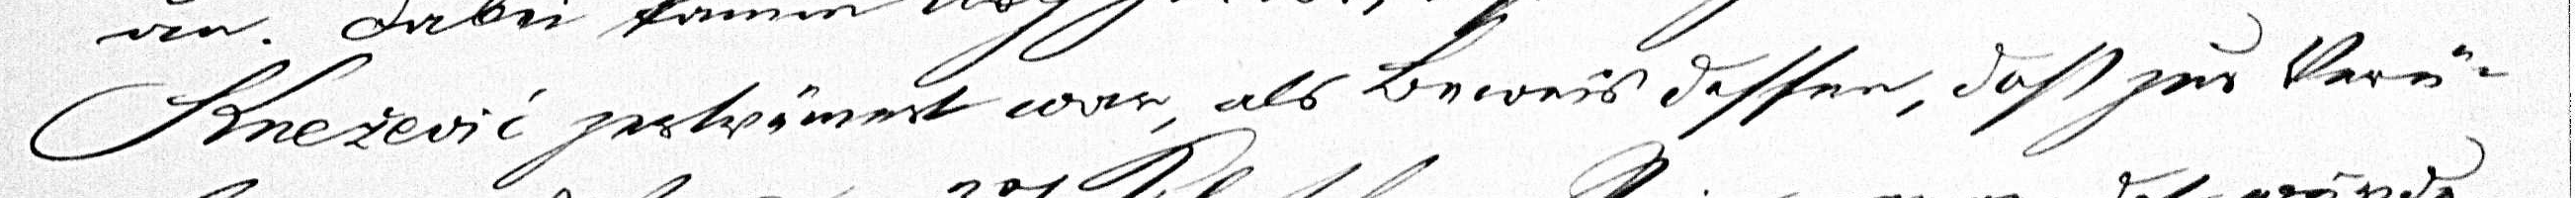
Knežević zertrümert war, als Beweis dessen, daß zur Verü¬
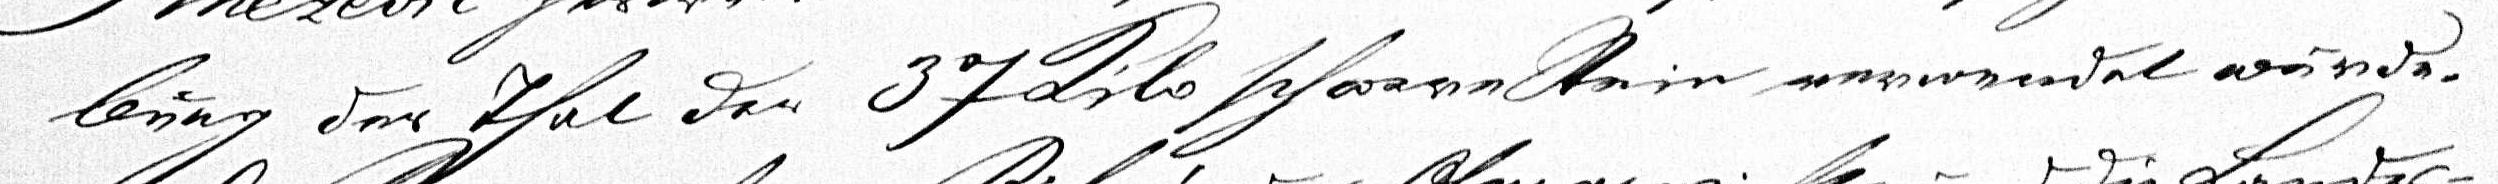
bung der That der 3°f Kilo schwere Stein verwendet wurde.
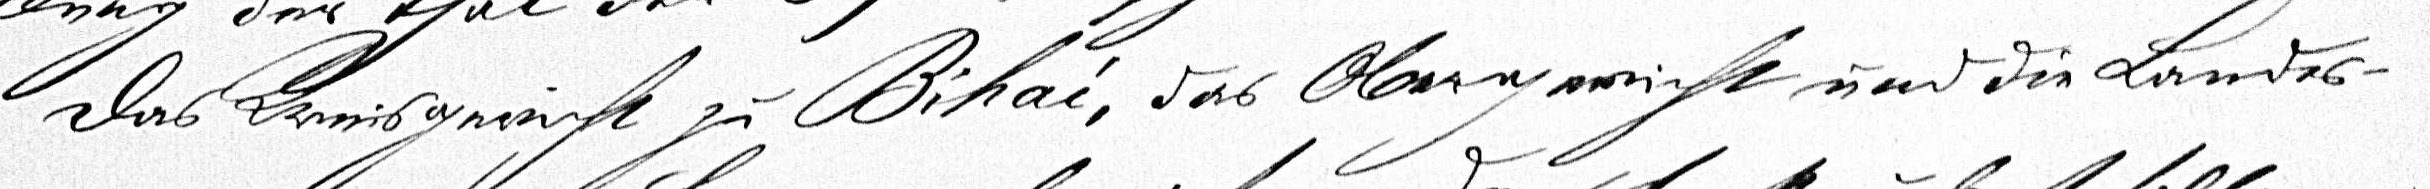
Das Kreisgericht zu Bihać, das Obergericht und die Landes¬
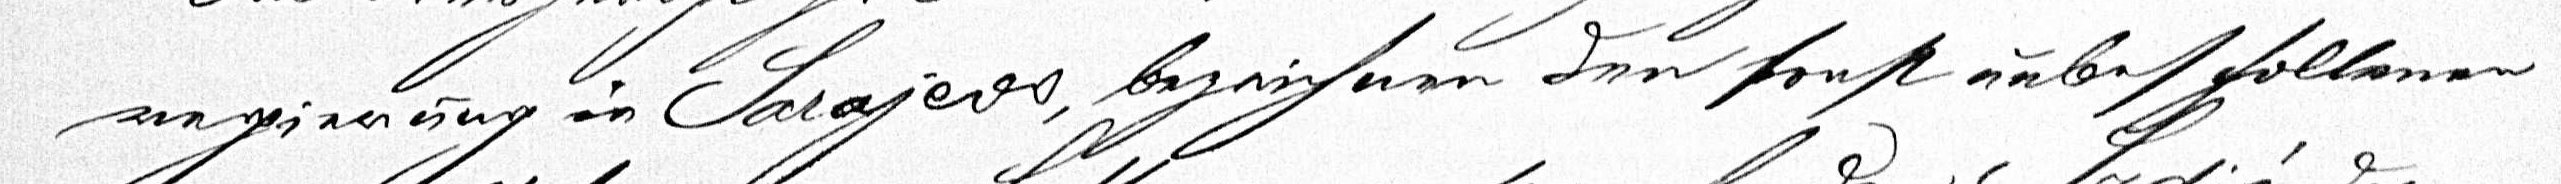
regierung in Sarajevo, bezeichnen den sonst unbescholtenen
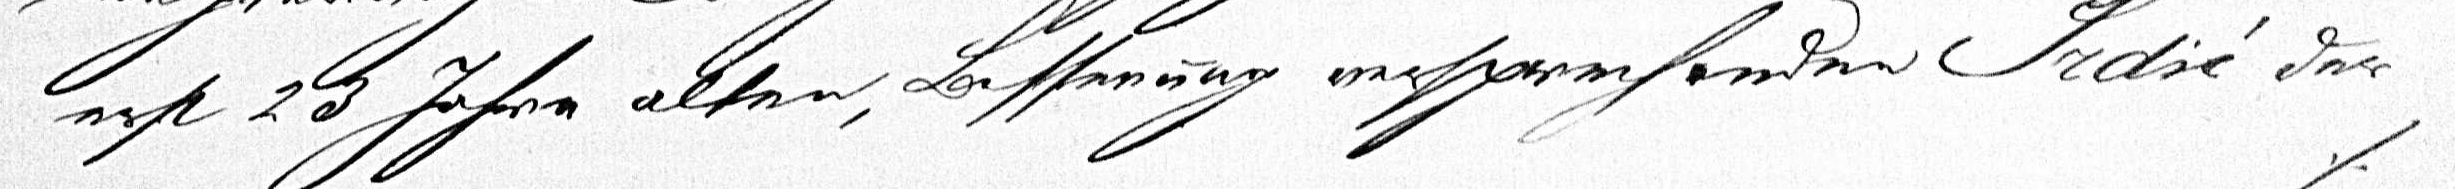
erst 23 Jahre alten, Besserung versprechenden Srdić der
